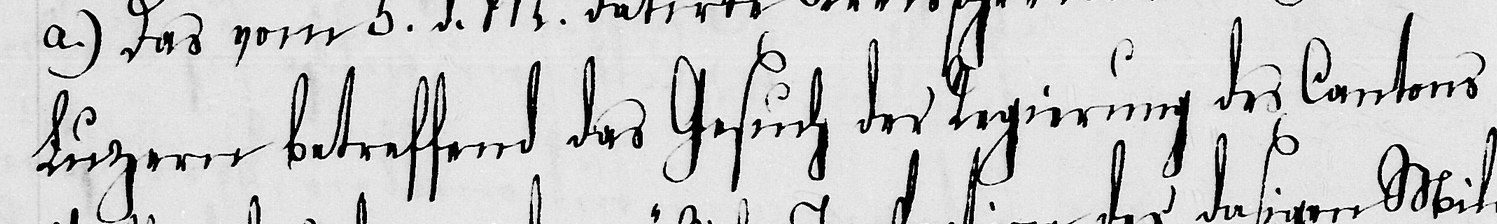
Luzern betreffend das Gesuch der Regierung des Cantons
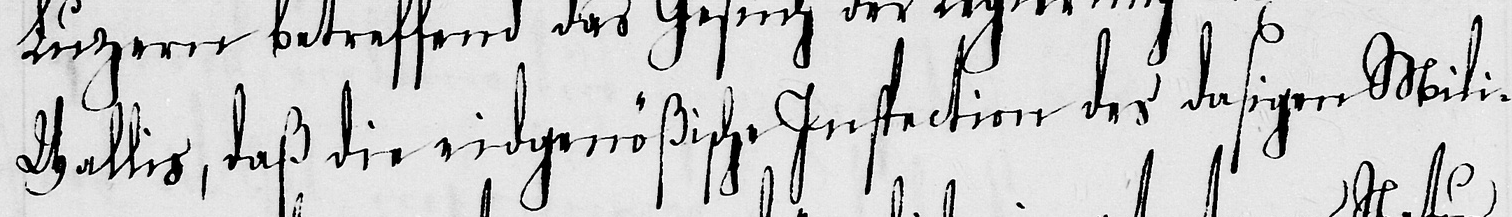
Wallis, daß die eidgenößische Inspection des dasigen Mili¬
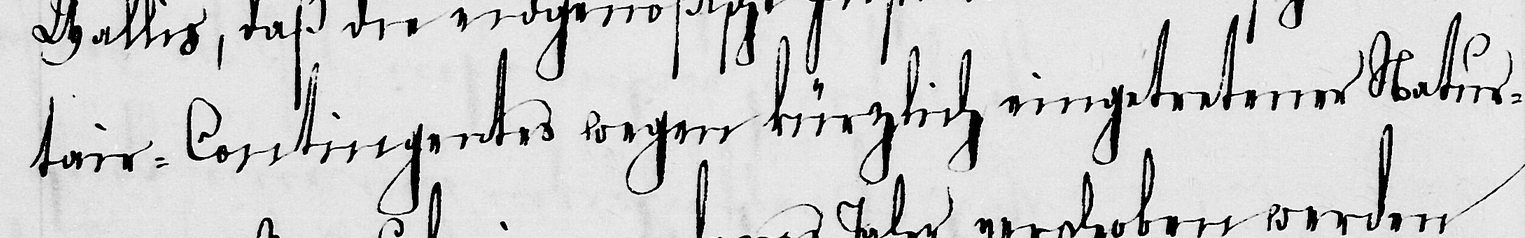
tair-Contingentes wegen kürzlich eingetretener Natur¬
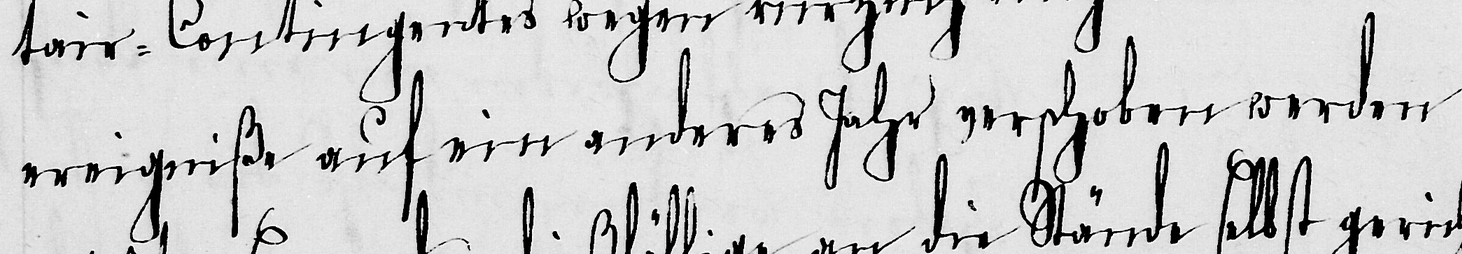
ereigniße auf ein anderes Jahr verschoben werden
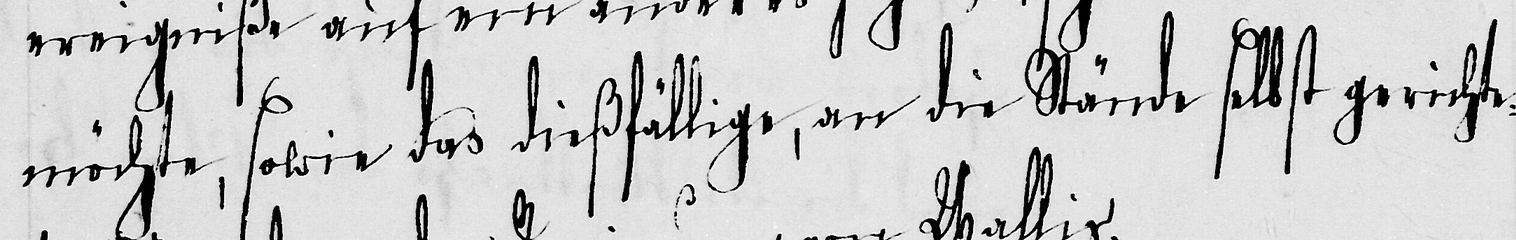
möchte, sowie das dießfällige, an die Stände selbst geric¬
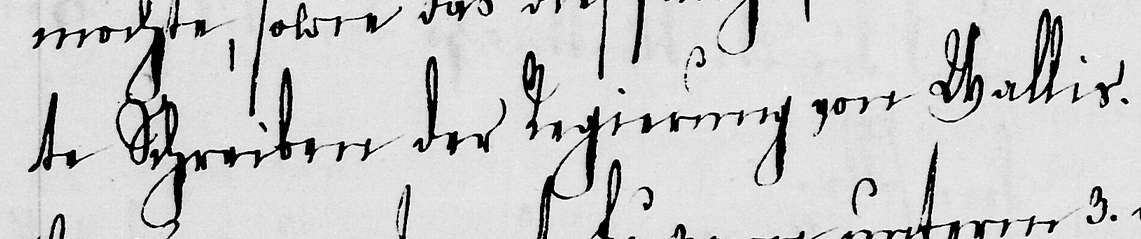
ete Schreiben der Regierung von Wallis.
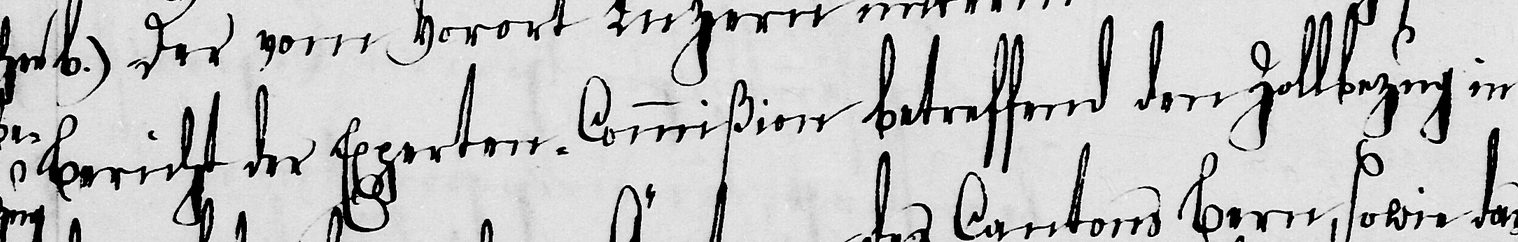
Bericht der Experten-Commißion betreffend den Zollbezug in
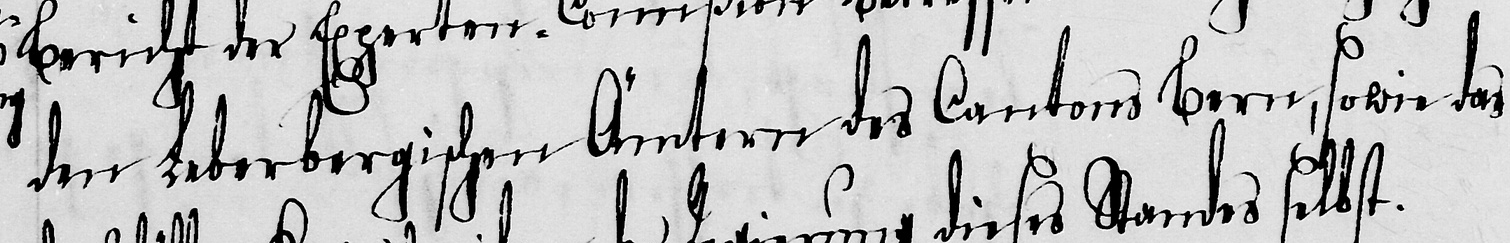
den Leberbergischen Ämtern des Cantons Bern, sowie
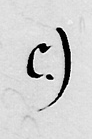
b.)
